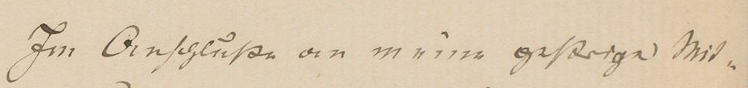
Im Anschluße an meine gestrige Mit-
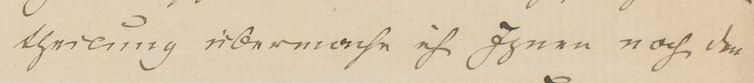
theilung übermache ich Ihnen noch den
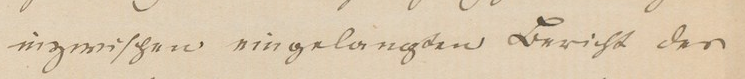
inzwischen eingelangten Bericht des
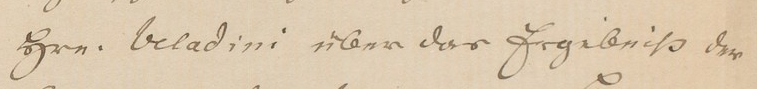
Hrn. Veladini über das Ergebniß der
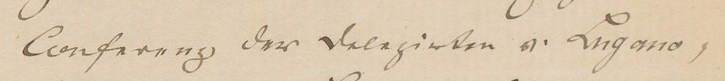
Conferenz der Delegirten v. Lugano,
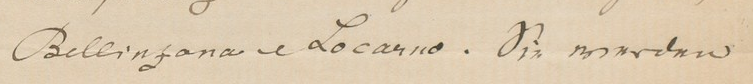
Bellinzona & Locarno. Sie werden
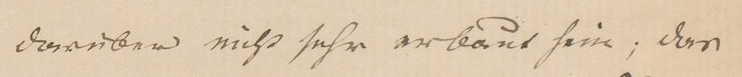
darüber nicht sehr erbaut sein; das
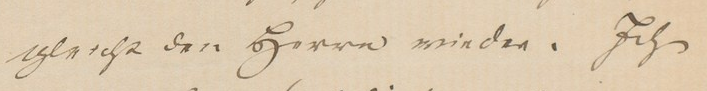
gleicht den Herrn wieder. Ich
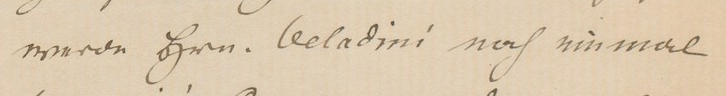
werde Hrn. Veladini noch einmal
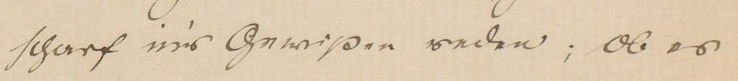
scharf in's Gewißen reden; ob es
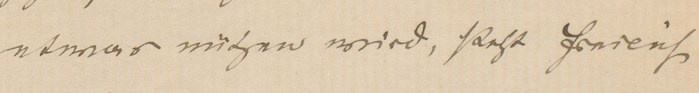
etwas nützen wird, steht freilich
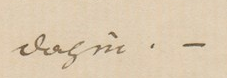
dahin. –
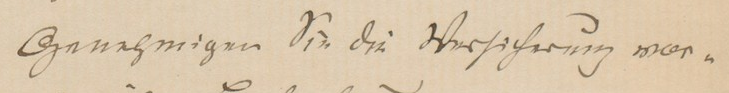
Genehmigen Sie die Versicherung vor-
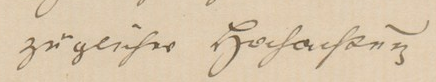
züglicher Hochachtung
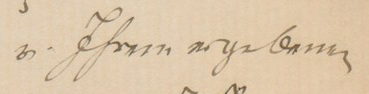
v. Ihrem ergebenen
